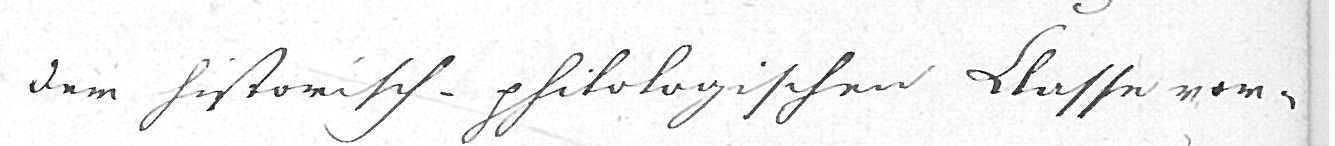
der historisch-philologischen Classe vor-
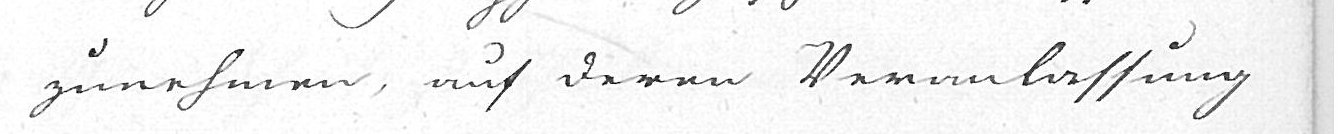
zunehmen, auf deren Veranlassung
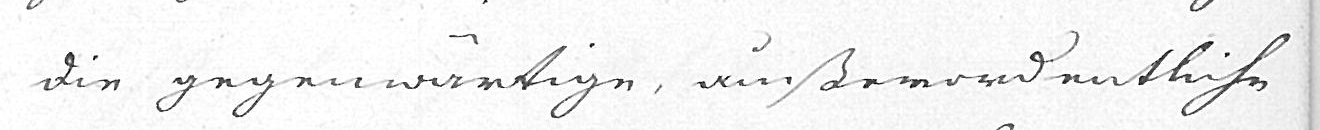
die gegenwärtige, außerordentliche
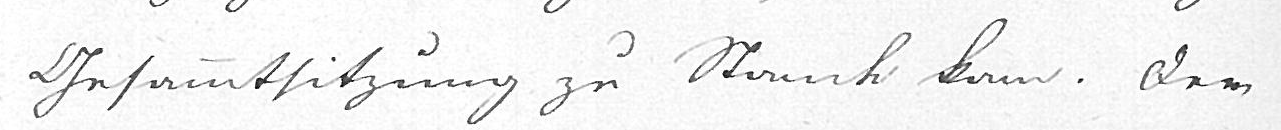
Gesammtsitzung zu Stande kam. Der
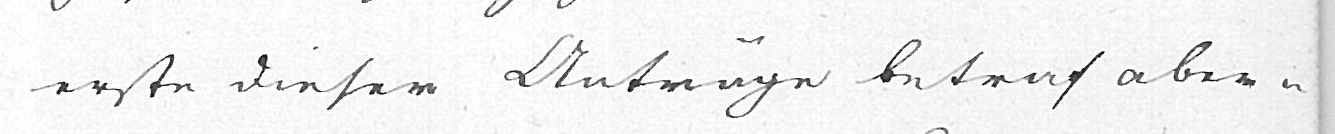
erster dieser Anträge betraf aber-
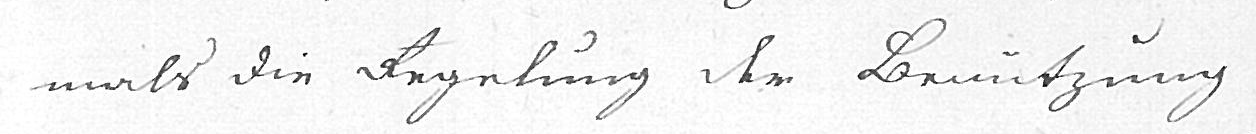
mals die Regelung der Benützung
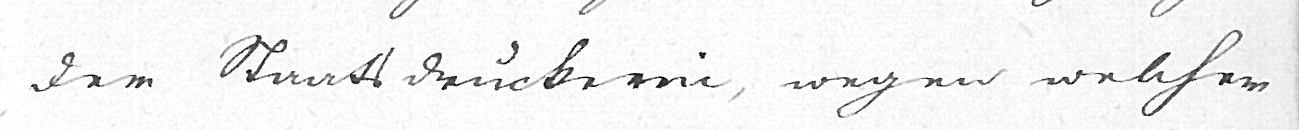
der Staatsdruckerei, wegen welcher
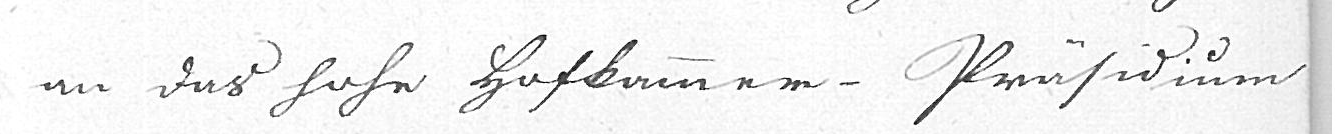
an das hohe Hofkammer-Präsidium
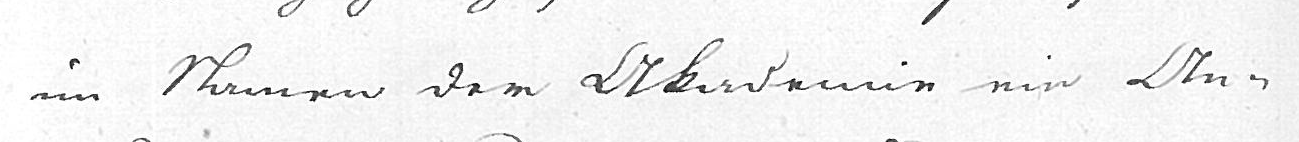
im Namen der Akademie ein An-
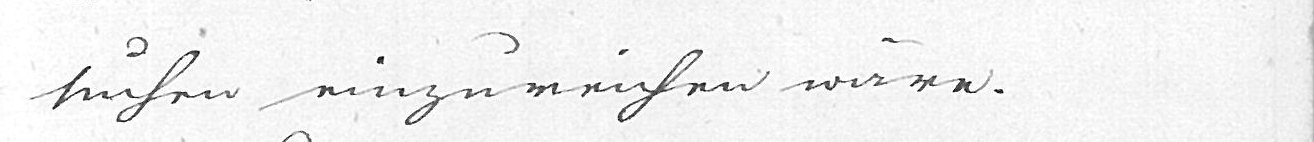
suchen einzureichen wäre
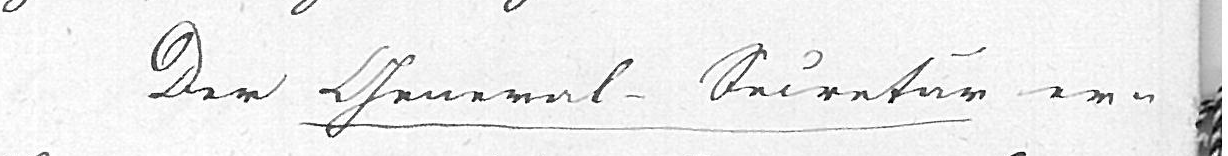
Der General-Secretär er-
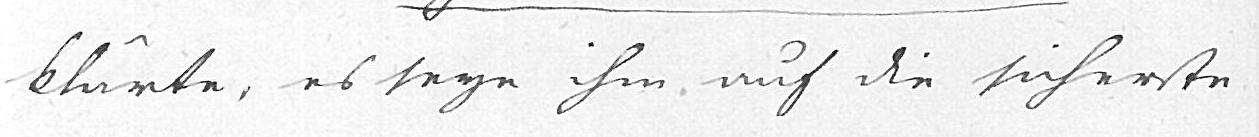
klärte, es seye ihm auf die sicherste
